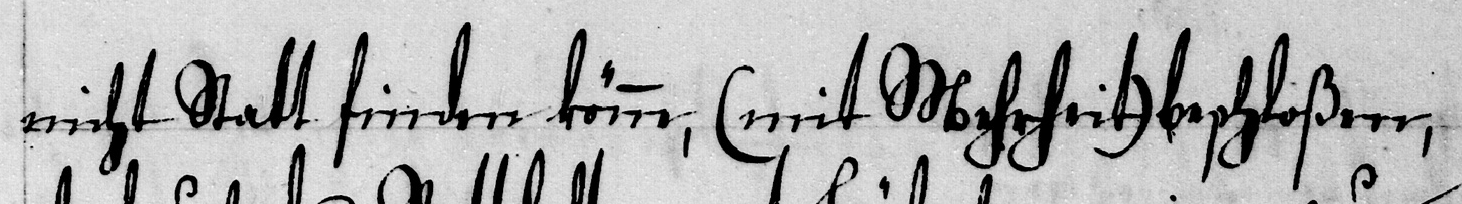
nicht Statt finden könne, (mit Mehrheit) beschloßen,
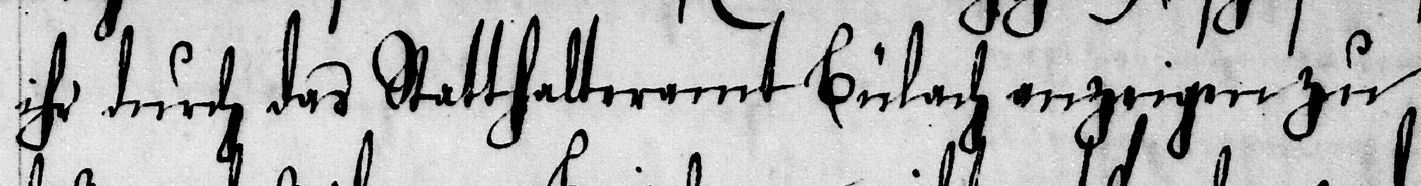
ihr durch das Statthalteramt Bülach anzeigen zu
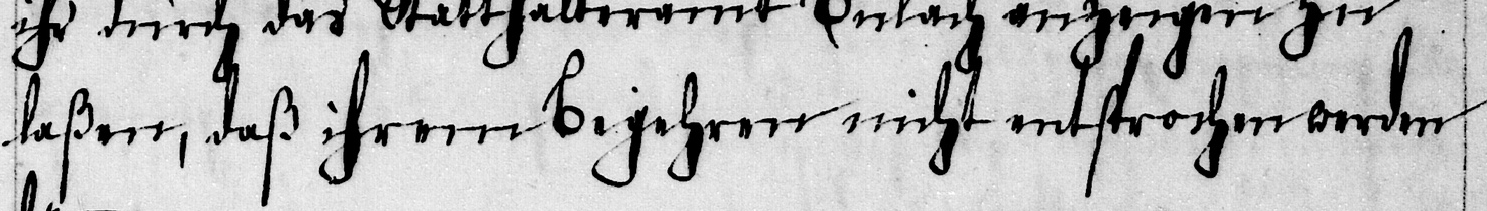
laßen, daß ihrem Begehren nicht entsprochen werden
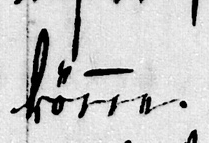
könne.
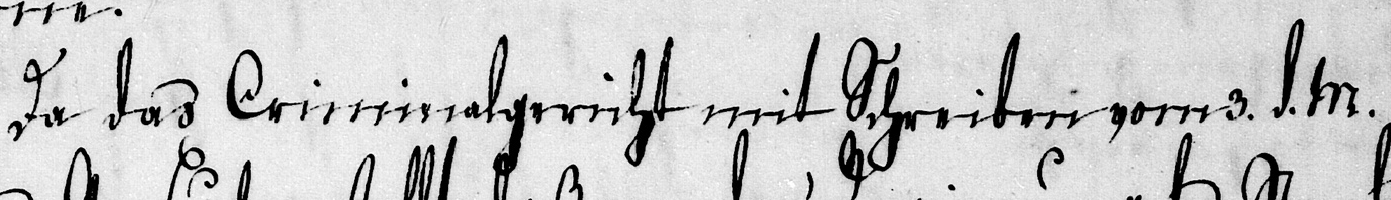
Da das Criminalgericht mit Schreiben vom 3. d. M.
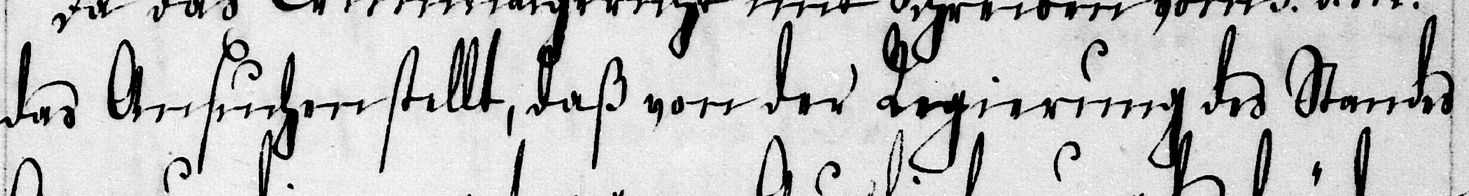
das Ansuchen stellt ,daß von der Regierung des Standes
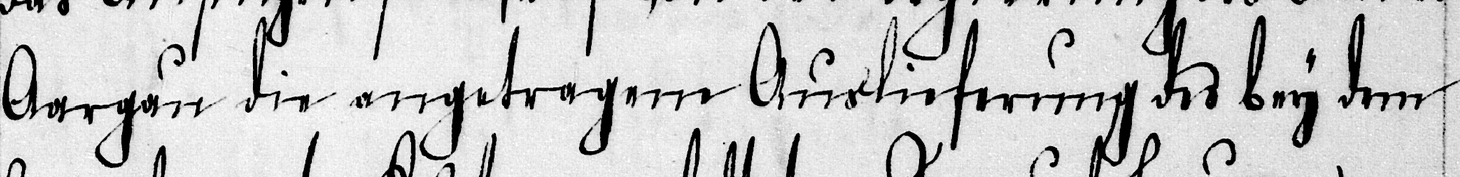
Aargau die angetragene Auslieferung des bey dem
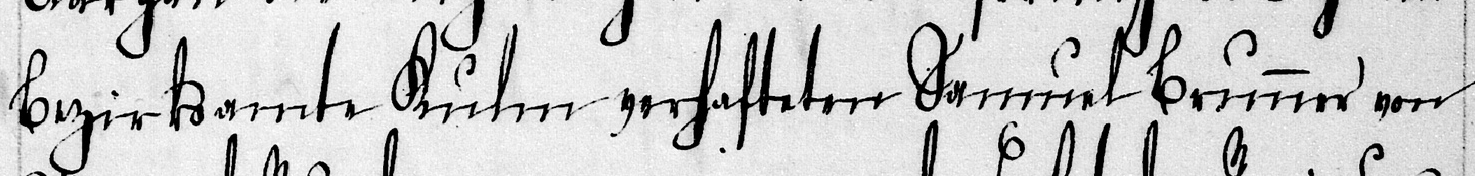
Bezirksamte Kulm verhafteten Samuel Brunner von
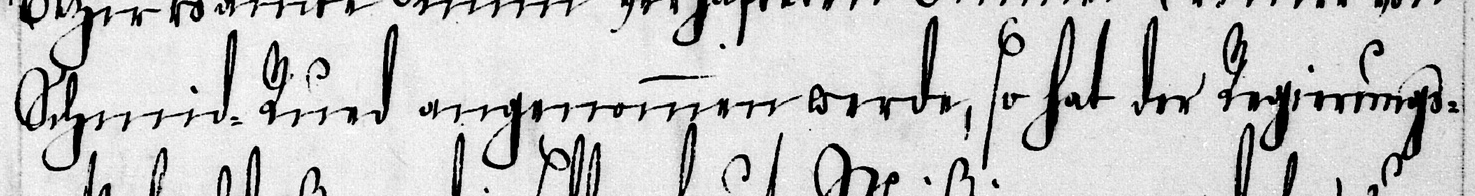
Schmid-Rued angenommen werde, so hat der Regierungs¬
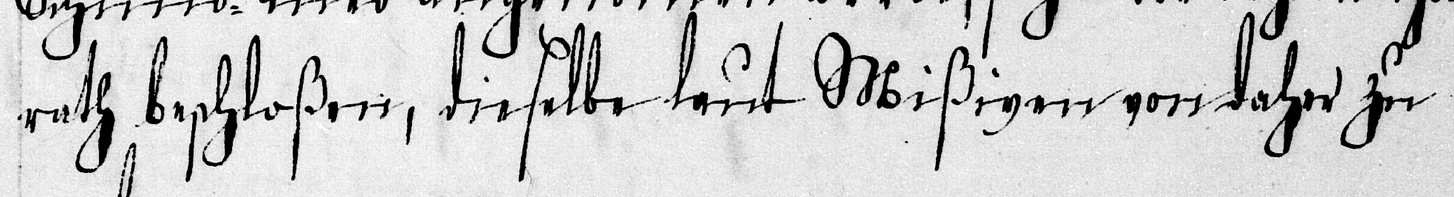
rath beschloßen, dieselbe laut Mißiven von daher zu
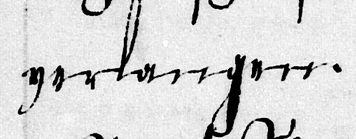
verlangen.
